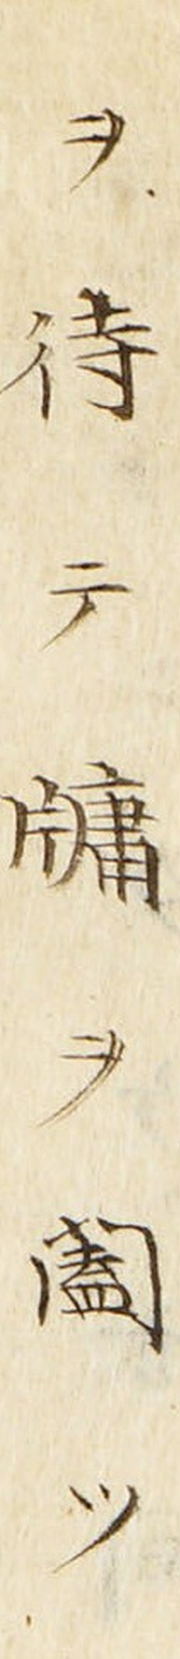ヲ待テ牅ヲ闔ツ
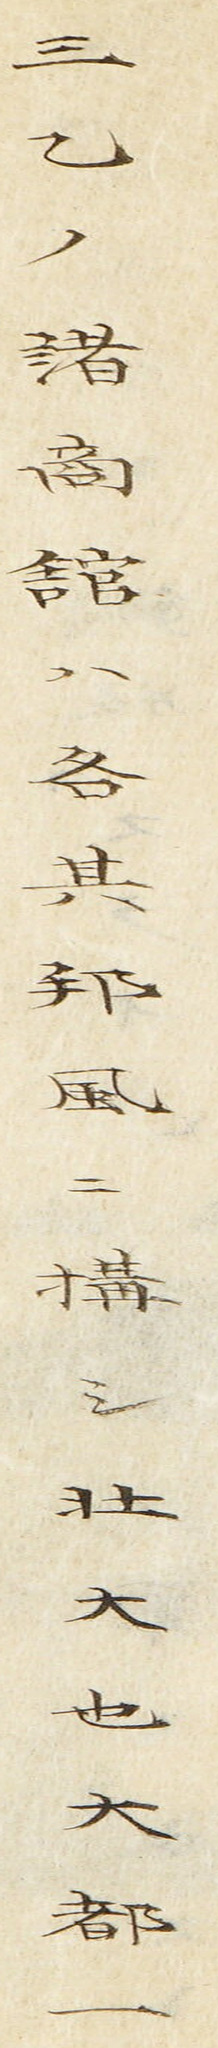〇三乙ノ諸商館ハ各其邦風ニ構シ壮大也大都一
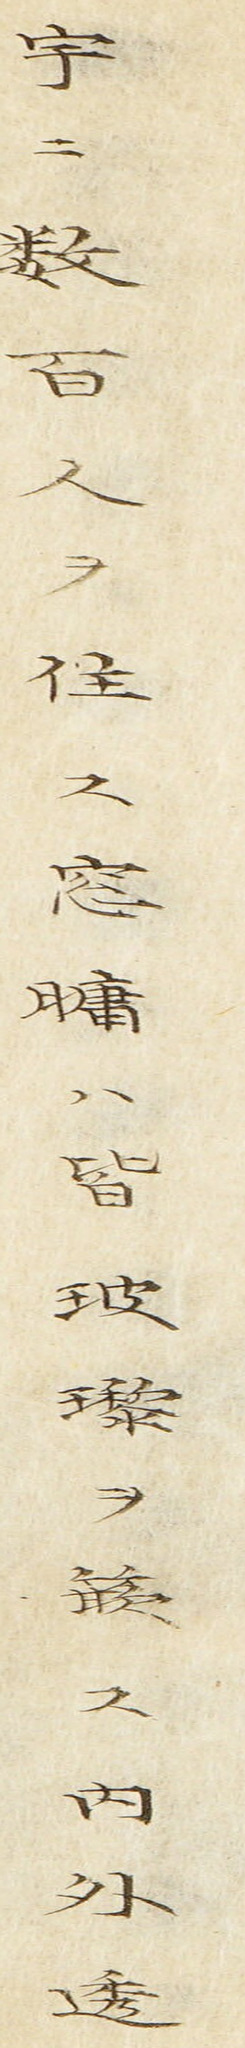宇ニ数百人ヲ住ス窓ハ皆玻瓈ヲ嵌ス内外透
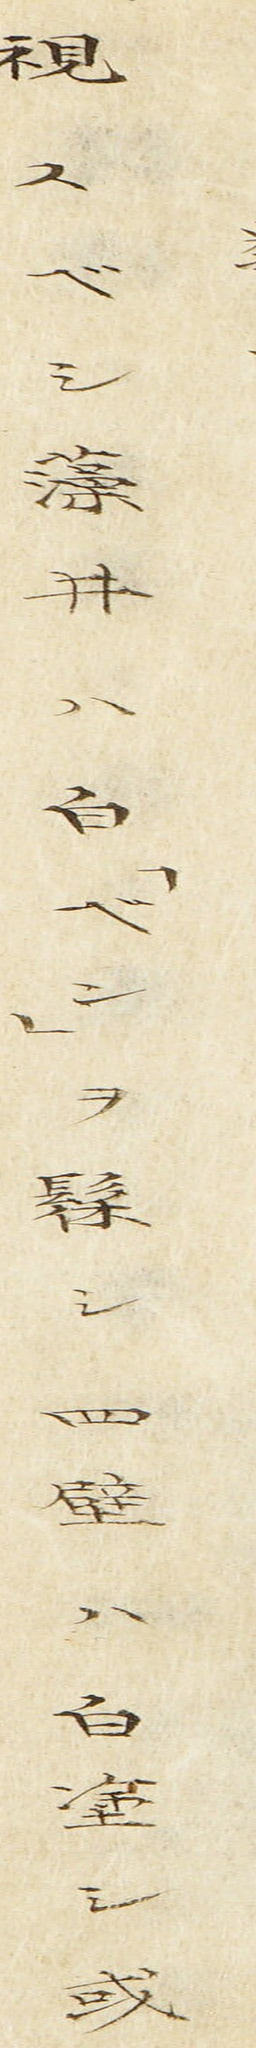視スベシ藻井ハ白「ベン」ヲ髹シ四壁ハ白塗シ或

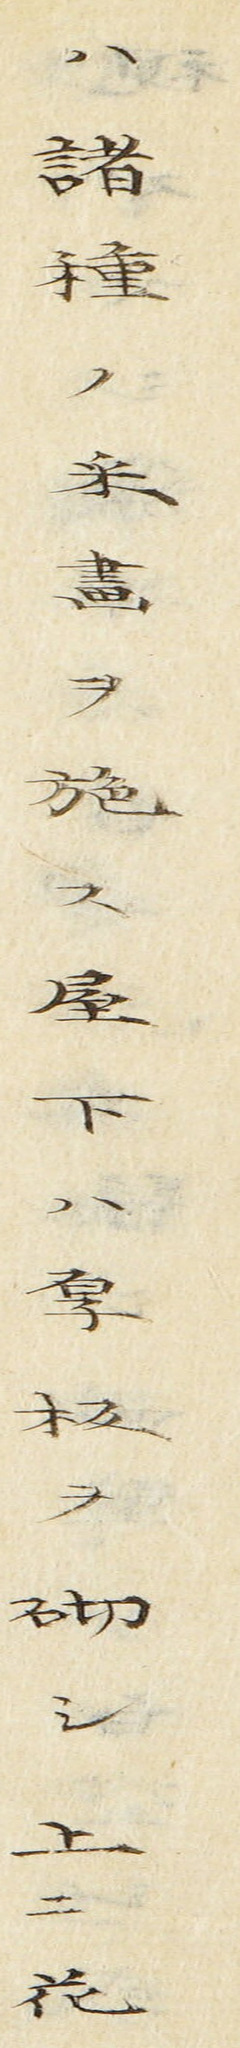ハ諸種ノ釆画ヲ施ス屋下ハ厚板ヲ砌シ上ニ花
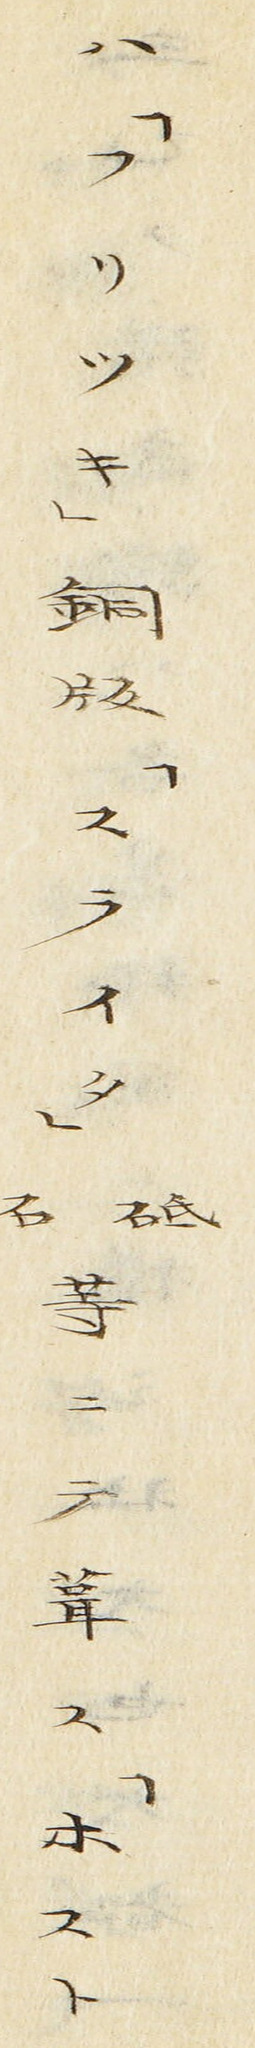ハ「フリツキ」銅版「スライタ」砥石等ニテ葺ス「ホスト
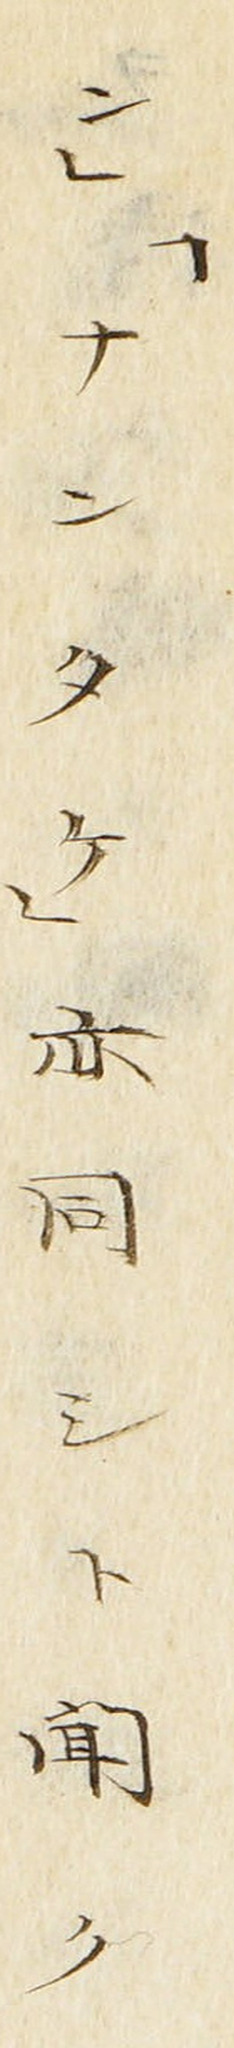ン」「ナンタケ」亦同シト聞ク
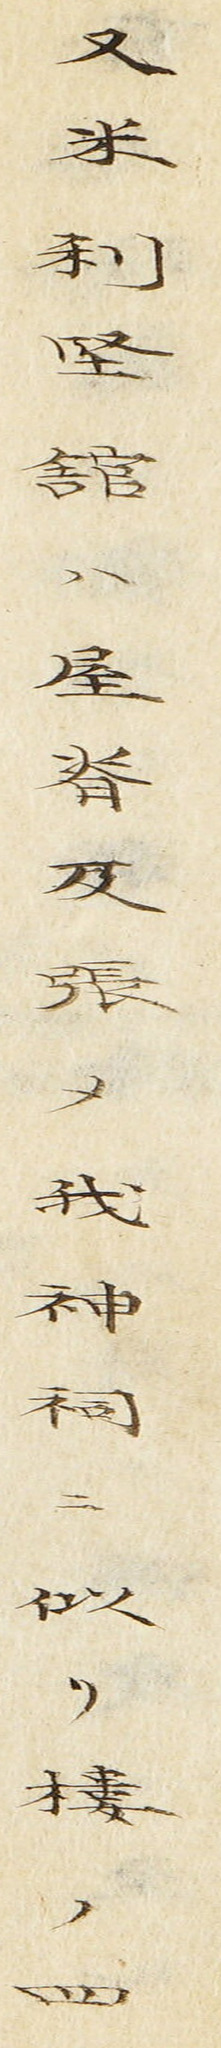〇又米利堅館ハ屋脊反張シテ我神祠ニ似リ楼ノ四
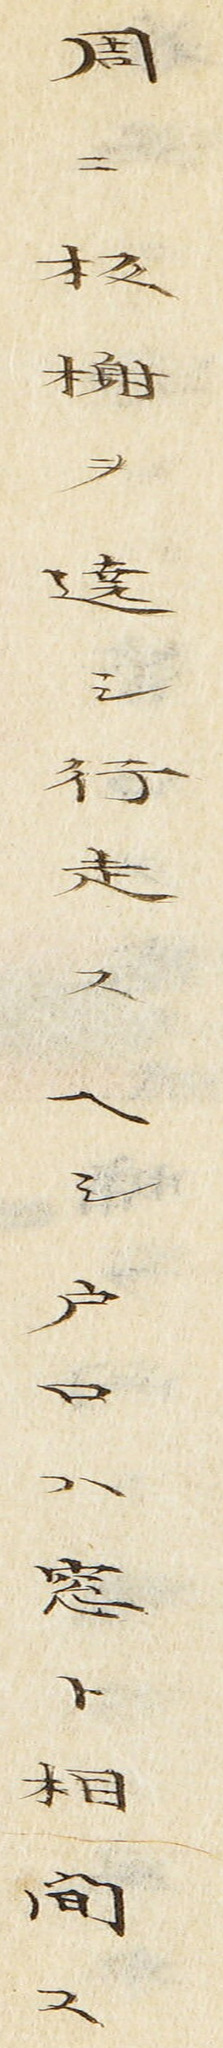周ニ板榭ヲ遶シ行走スヘシ戸口ハ窓ト相間ス
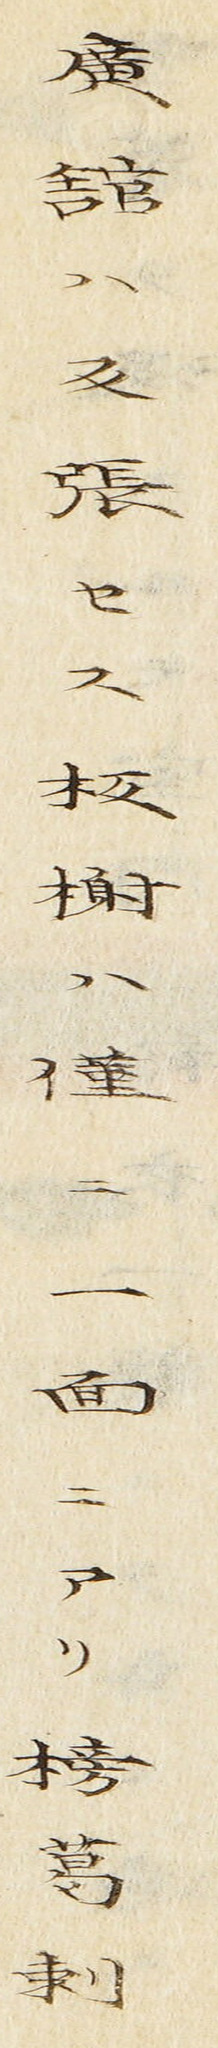広館ハ反張セス板榭ハ僅ニ一面ニアリ榜葛刺
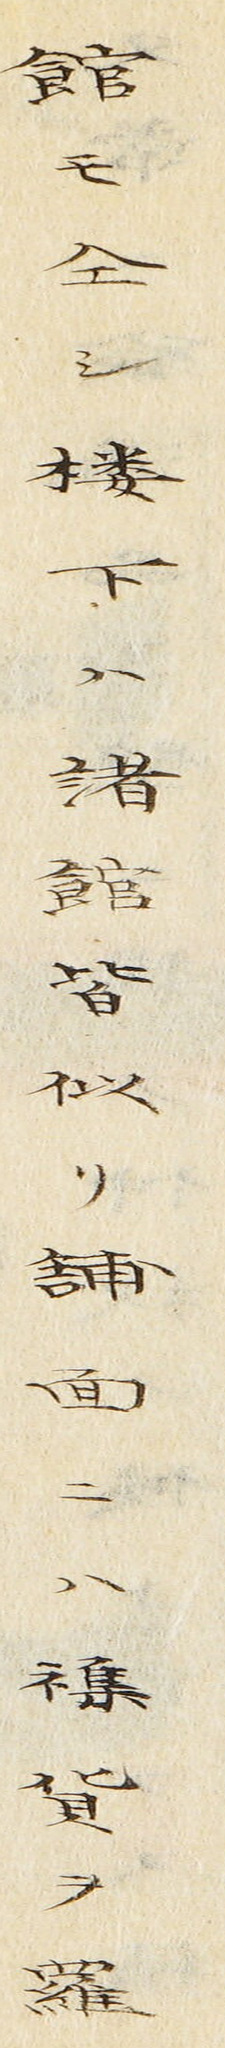館モ仝シ楼下ハ諸館皆似リ舗面ニハ襍貨ヲ羅
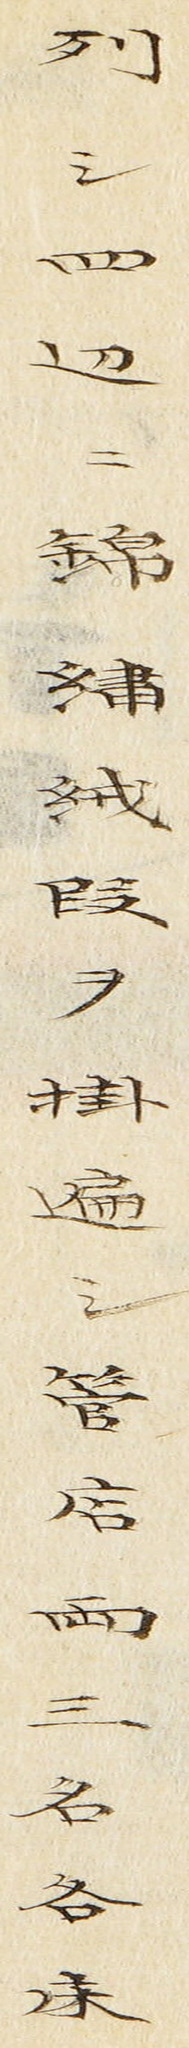列シ四辺ニ錦繍絨叚ヲ掛遍シ管店両三名各床
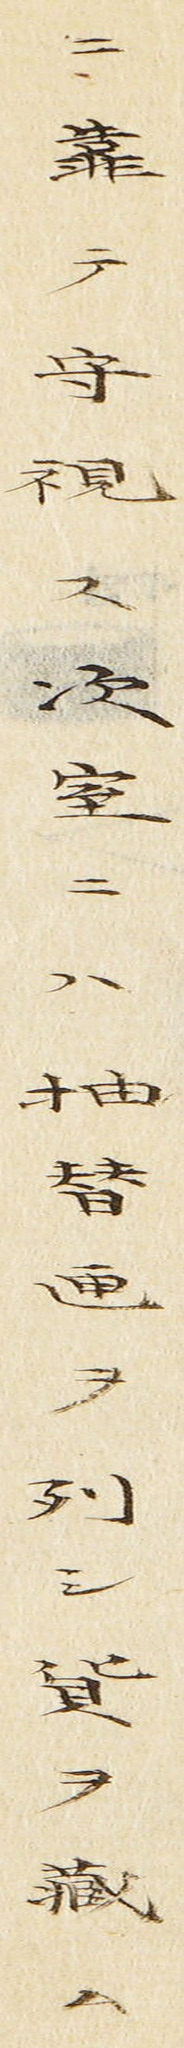ニ靠テ守視ス次室ニハ抽替匣ヲ列シ貨ヲ蔵ム
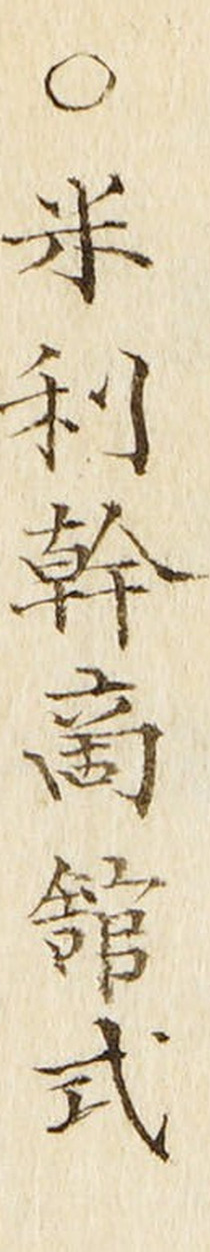〇米利幹商館式
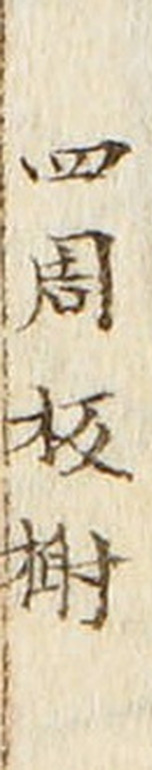四周板榭
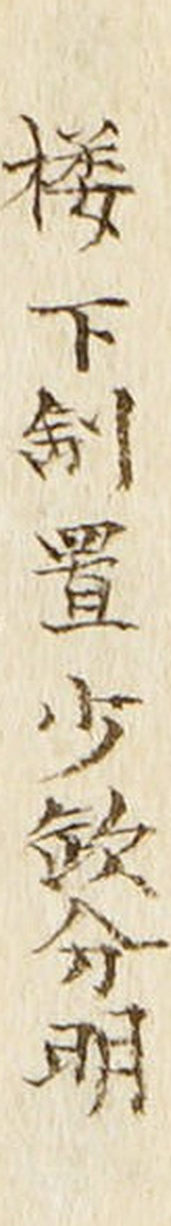楼下制置少欫分明
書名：蕃談
